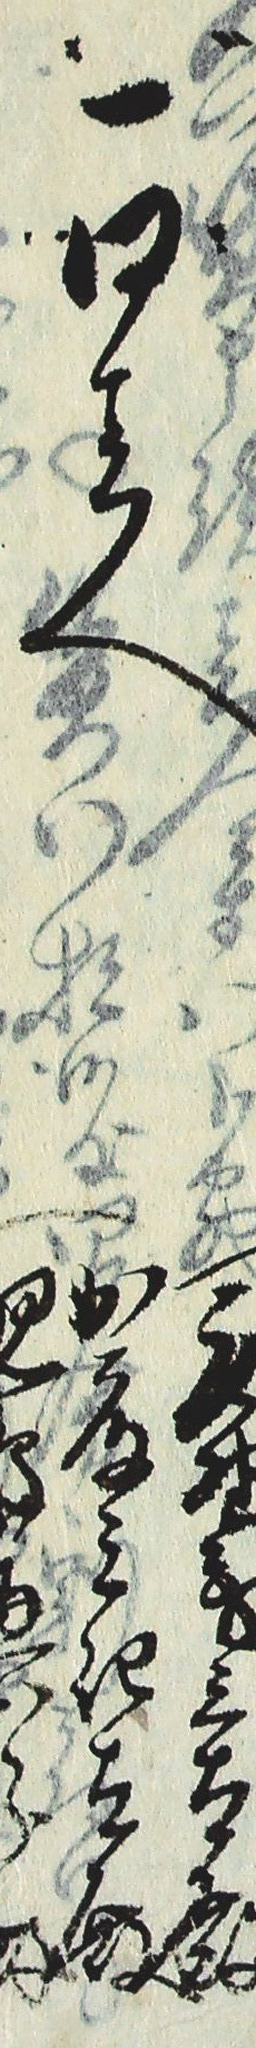一同壱人加藤三紀太殿
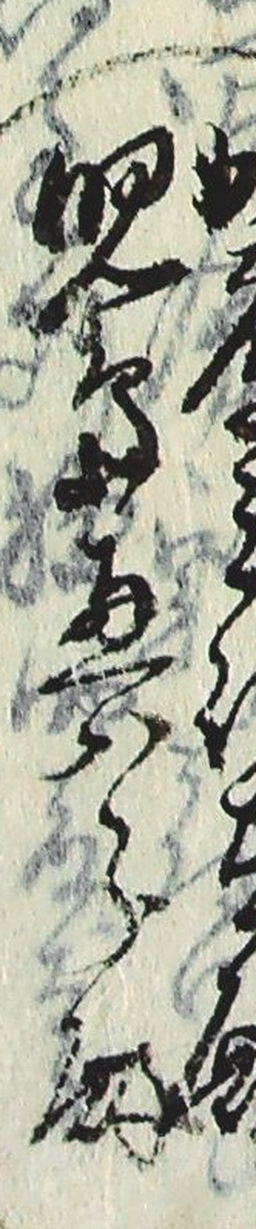児島恵八郎殿

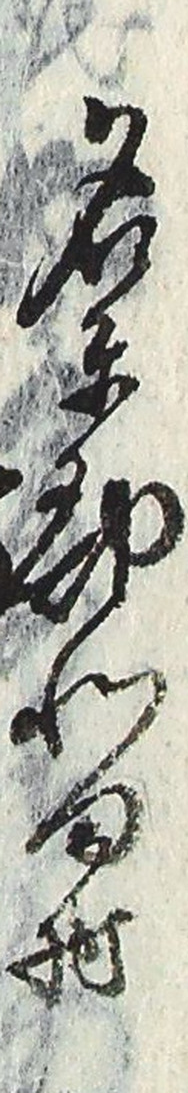名東郡和田村
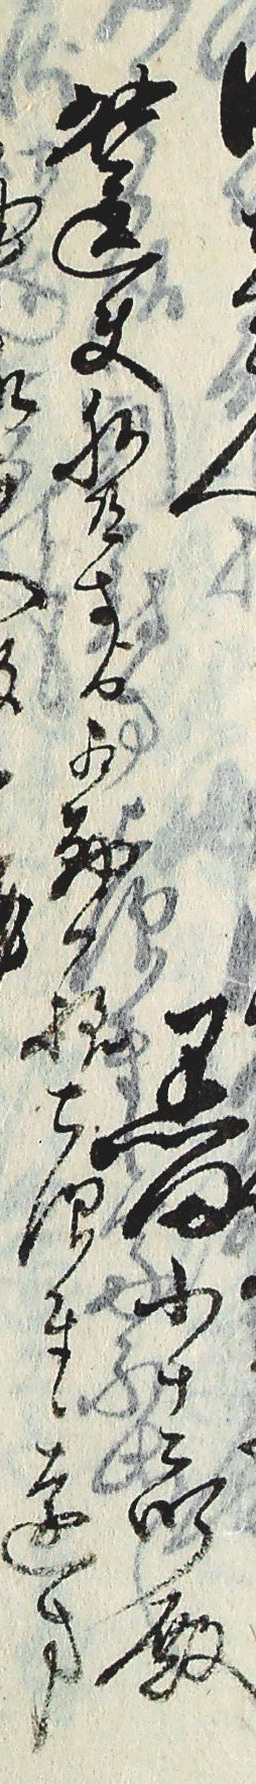此送夫私共方ゟ相勤候様被仰付候遠方
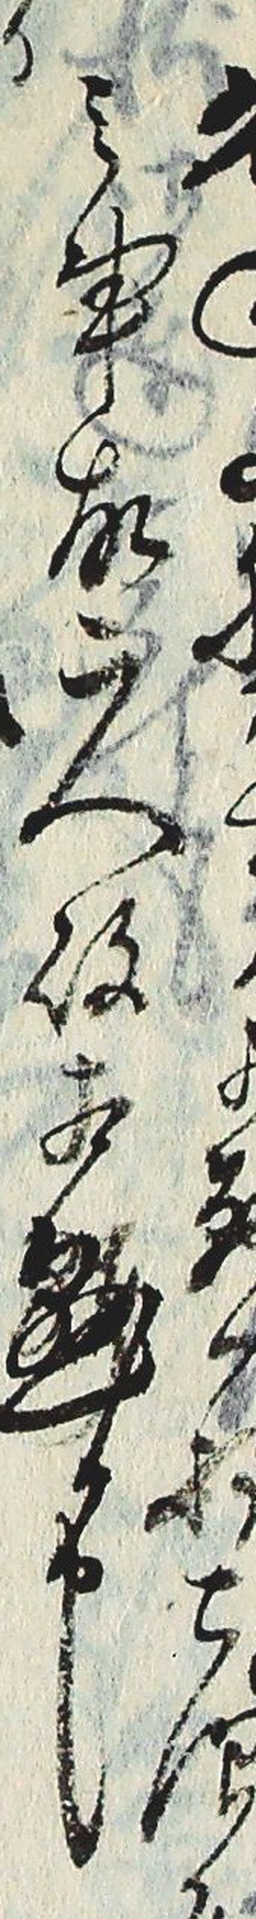之事故二人役相懸り申候
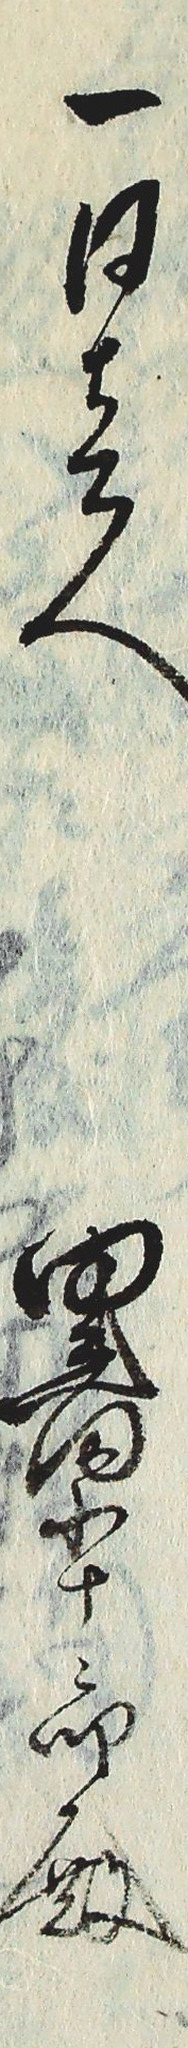一同壱人黒田小十郎殿
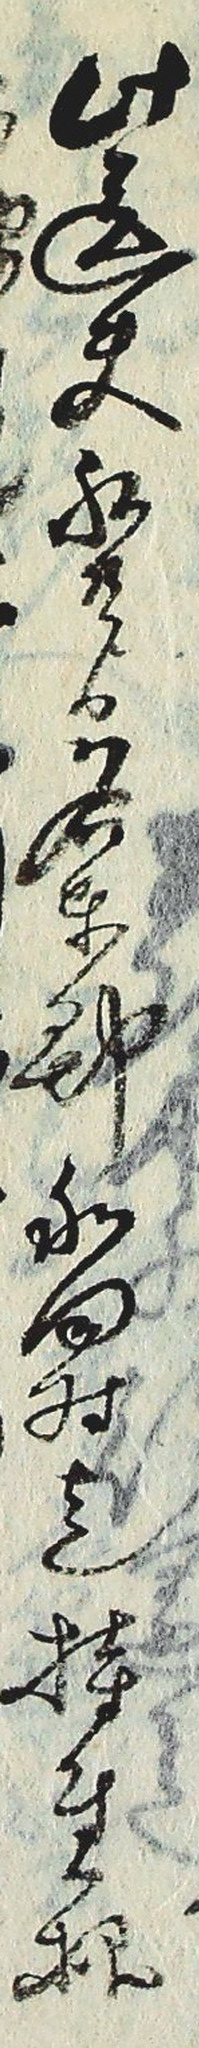此送夫私共ゟ名東郡和田村迄持付候様
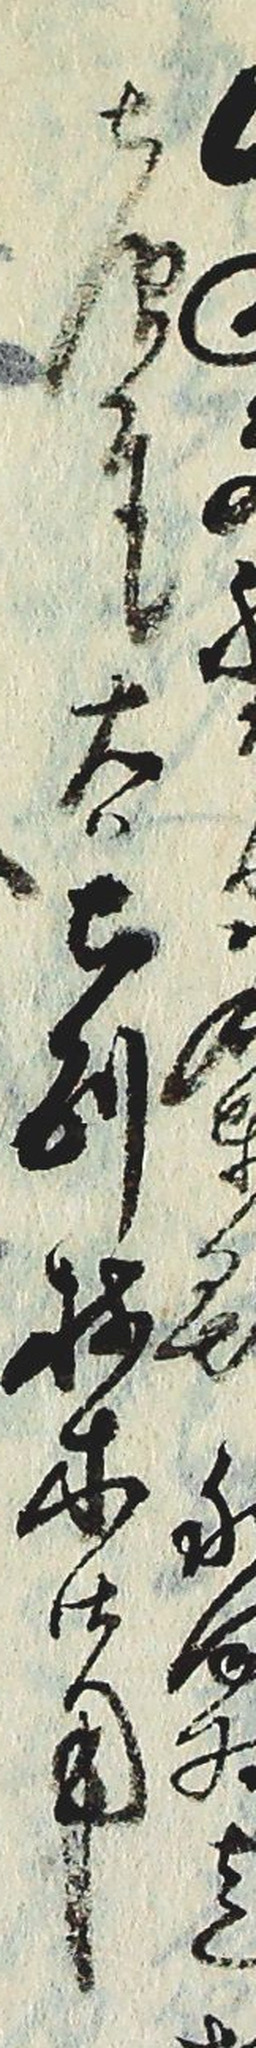被仰付候右は才判材木御用
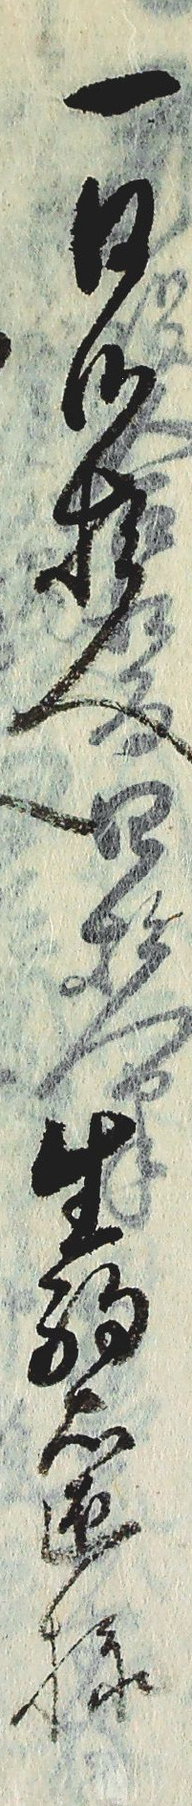一同弐拾人生駒忠匠様
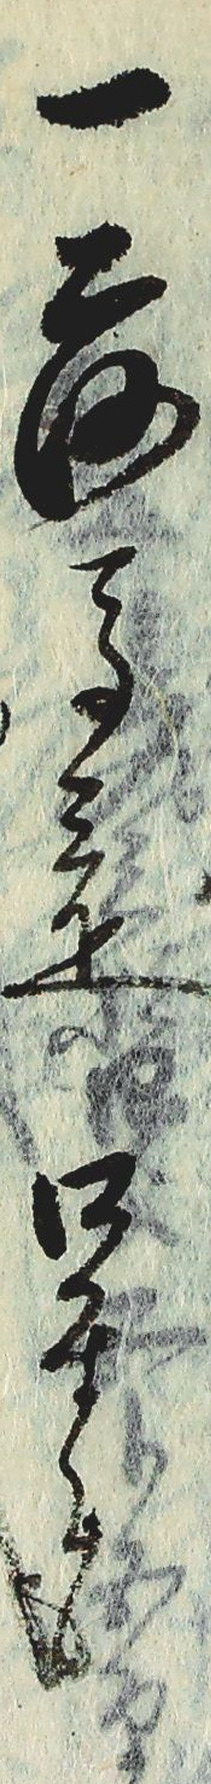一荷馬三疋口付とも
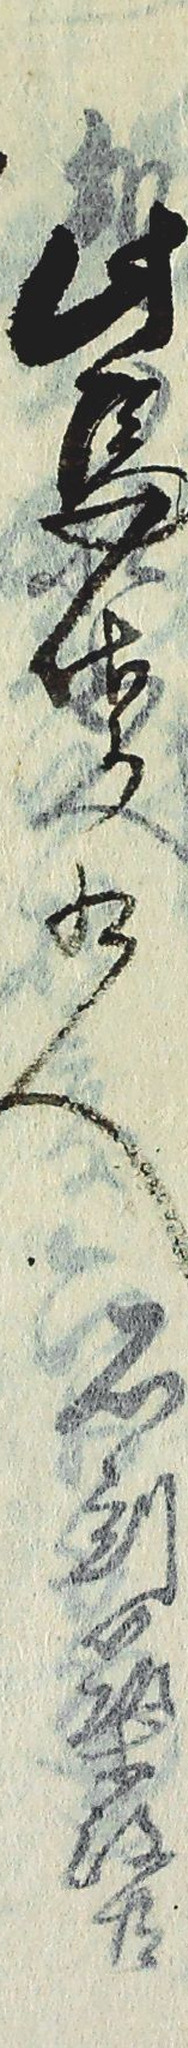此馬代り九人
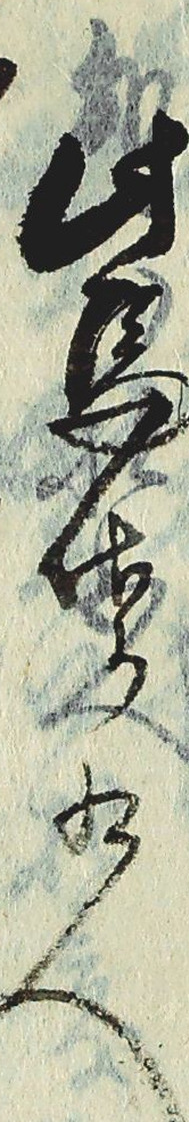此馬代り九人
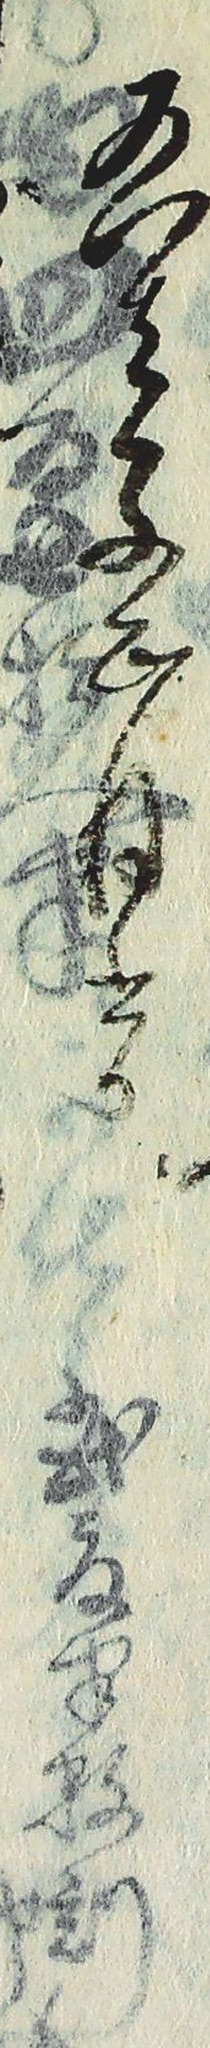右は子正月六日
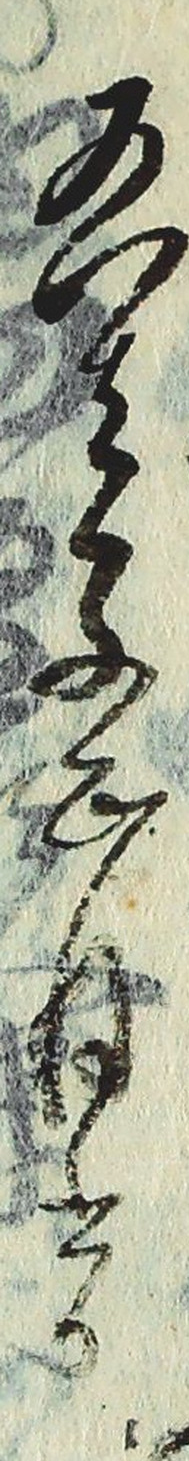右は子正月六日
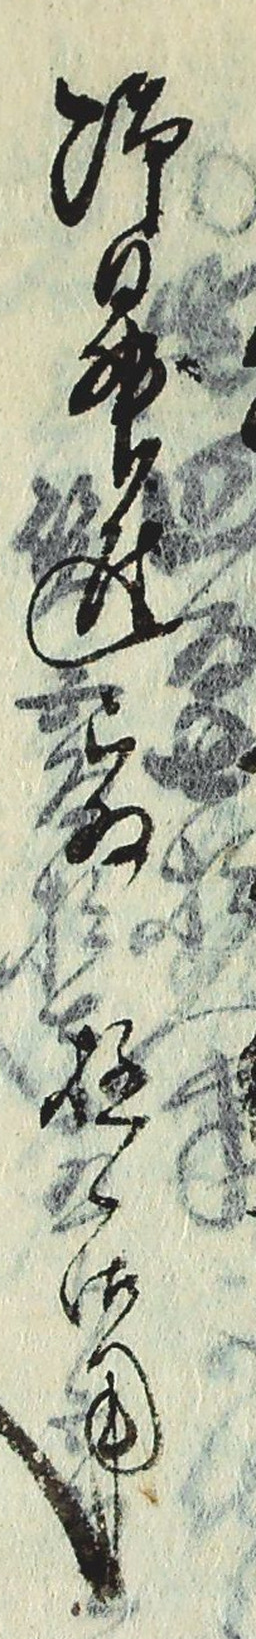御昇進被為遊候御用
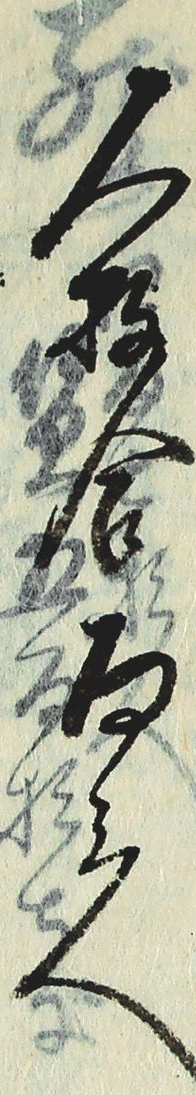人数合百三人
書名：名東郡中諸割賦元帳
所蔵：鳴門教育大学 Naruto University of Education
